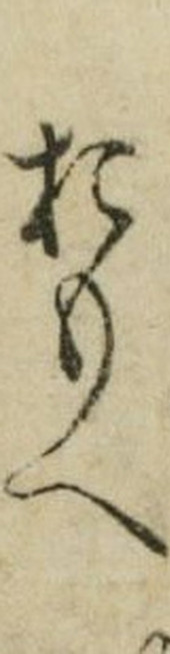おもへ
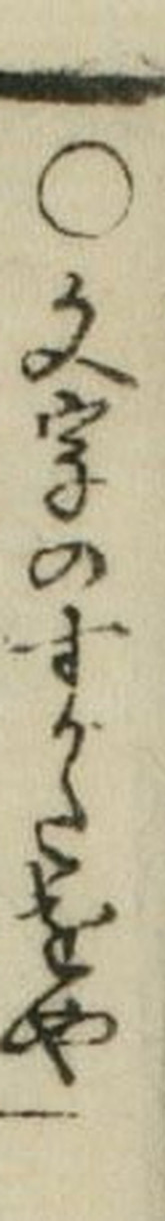○文字のすがたをや
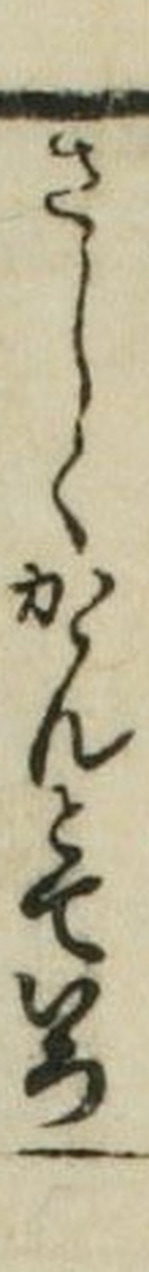さしくかゝんとていろ
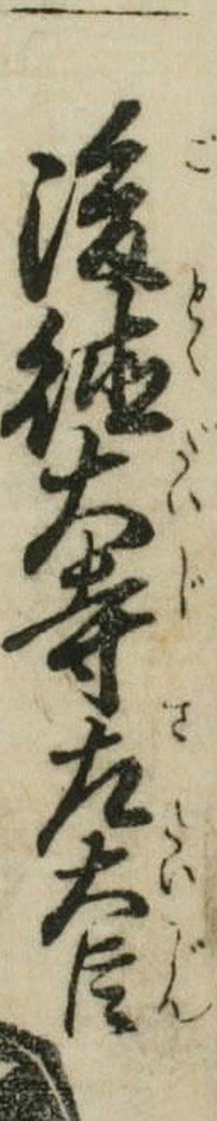後徳大寺左大臣
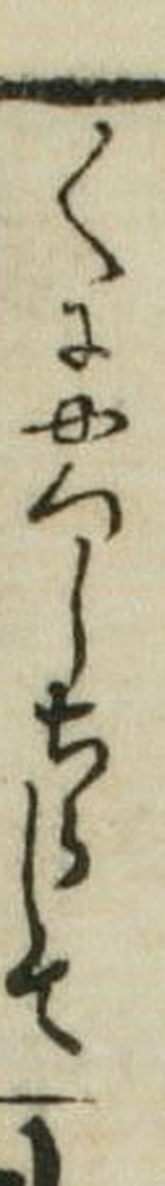〳〵にやつしちらして
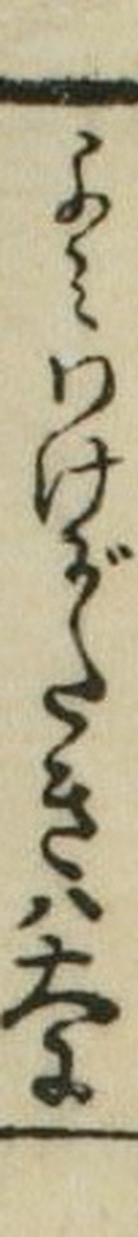ふみわけがたきは大に
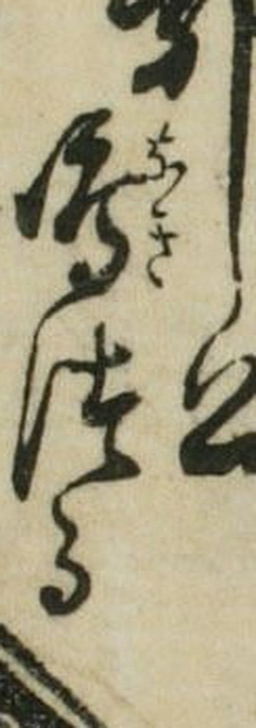鳴つる
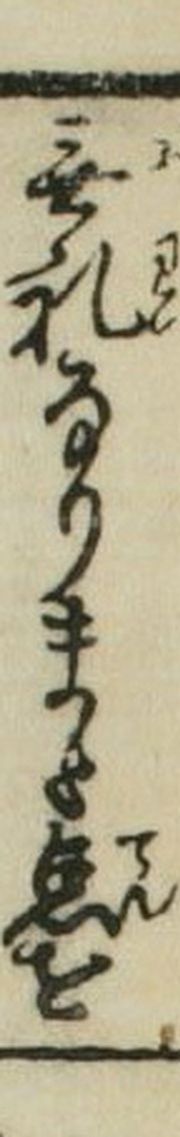無礼なりまた点を
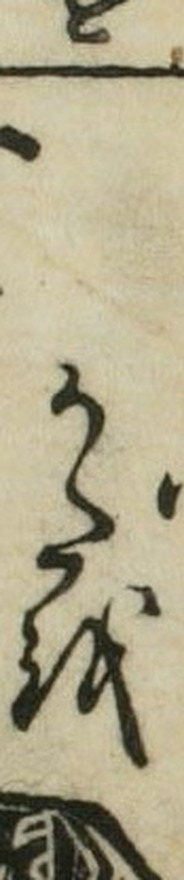かたを
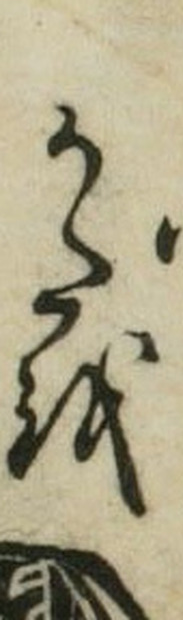かたを
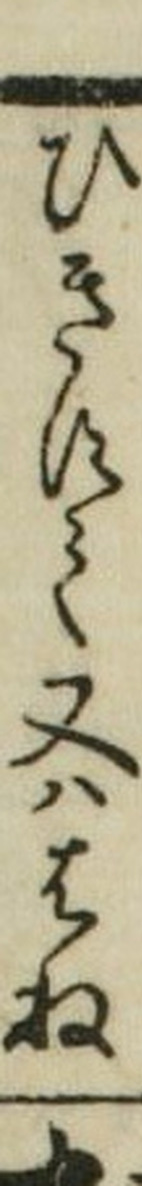ひきすて又ははね
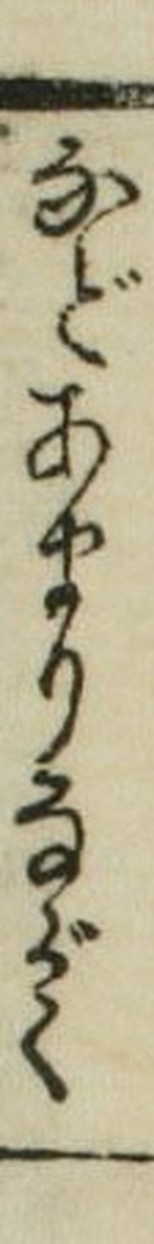などあまりながく
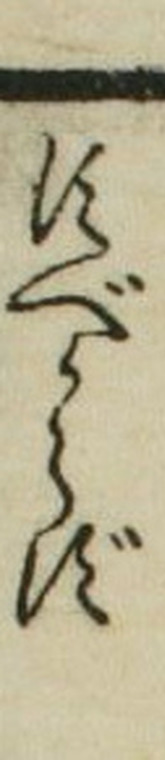すべからず
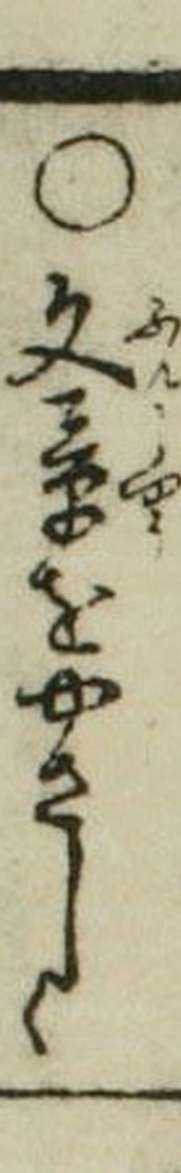○文章をやさしく
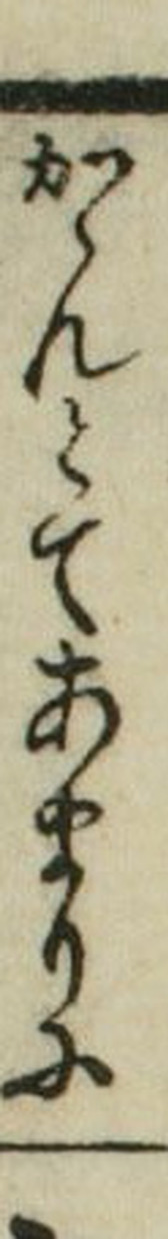かゝんとてあまりに
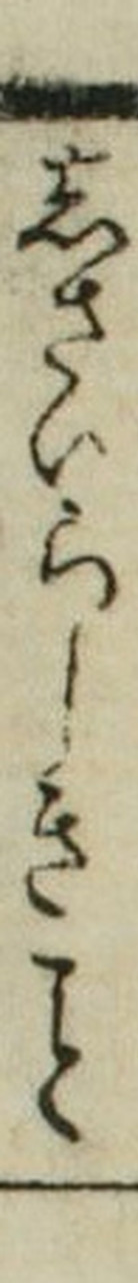しさいらしきこと
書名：百人一首
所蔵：東京学芸大学教育コンテンツアーカイブ
